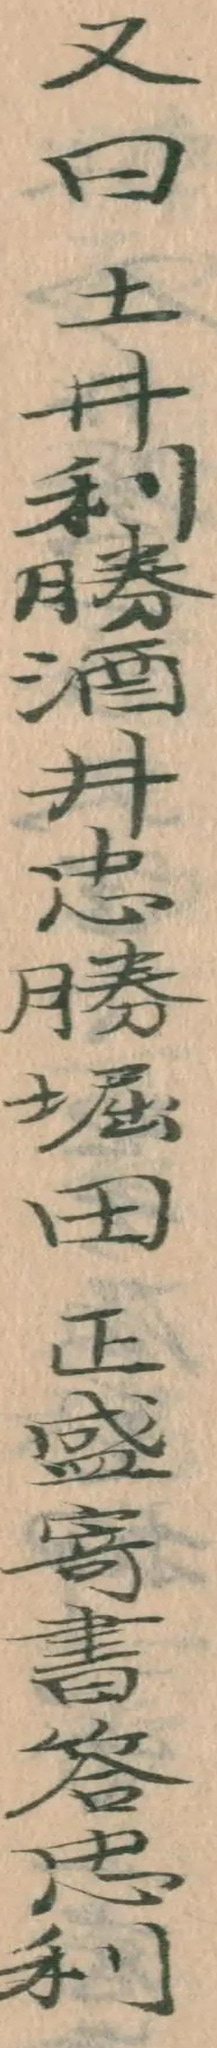又曰土井利勝酒井忠勝堀田正盛寄書答忠利
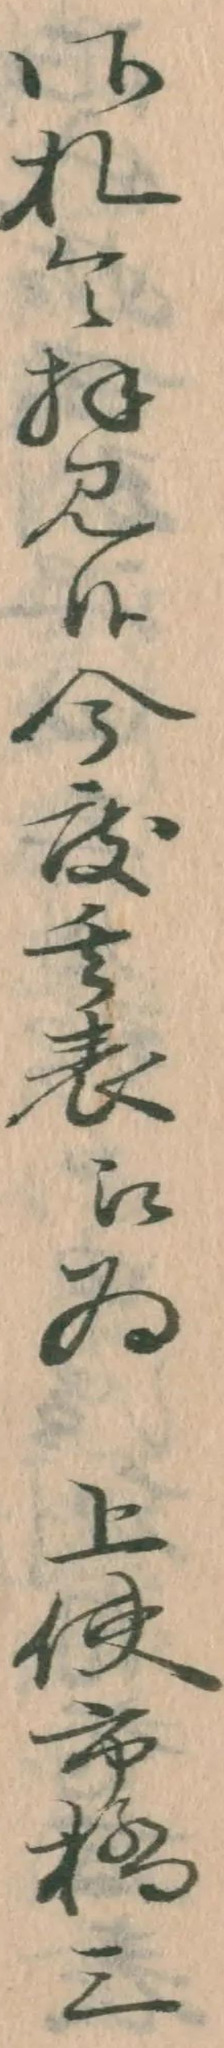御礼令拝見候今度其表江ゐ上使市橋三
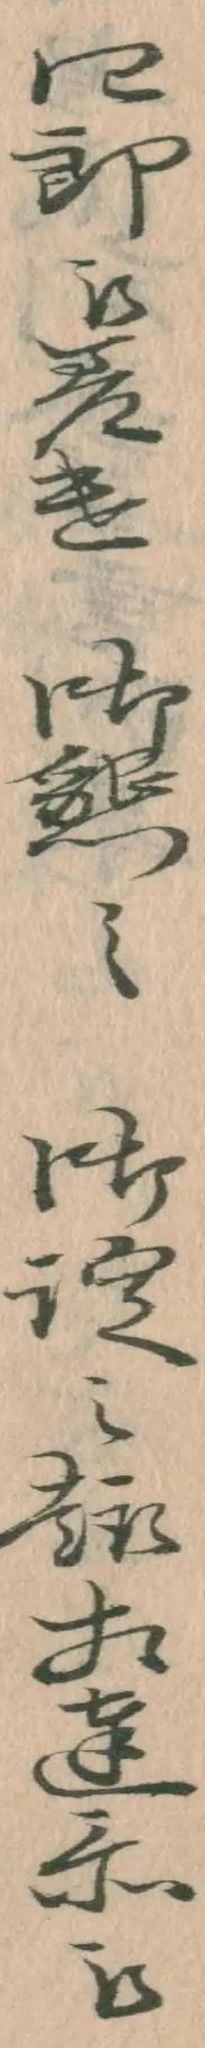四郎被差遣御懇之御諚之趣相達忝被
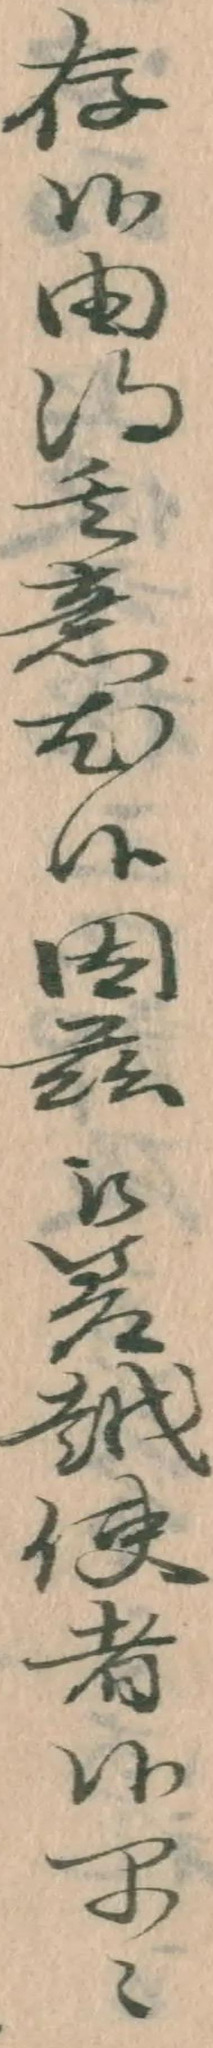存候由得其意尤候固茲被差越使者候早々
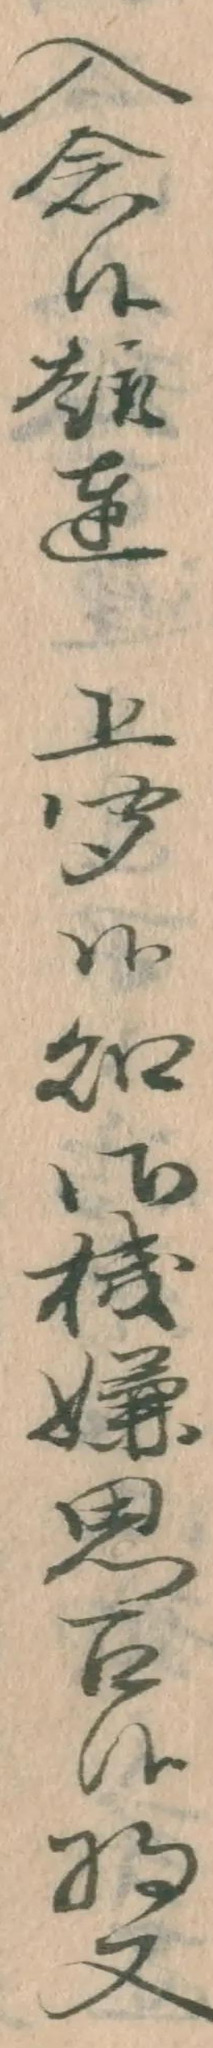入念候趣達上聞候処御機嫌思召候将又
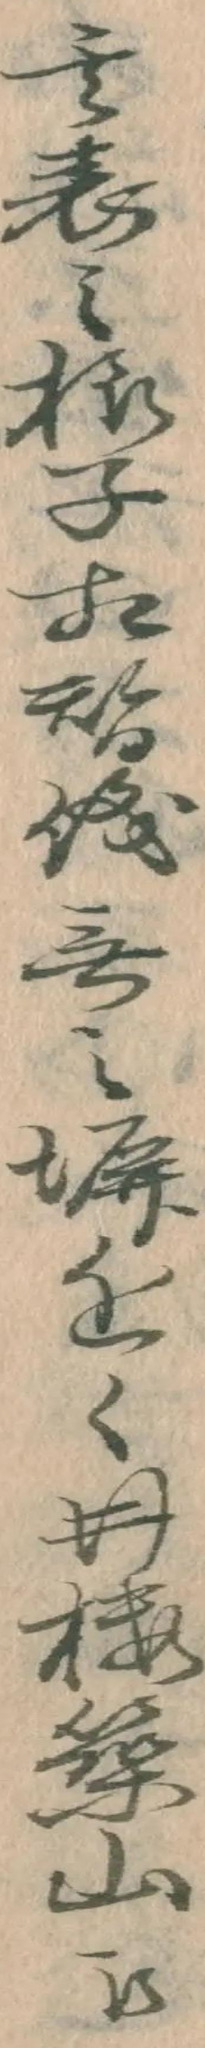其表之様子相替儀無之塀近く井樓築山被
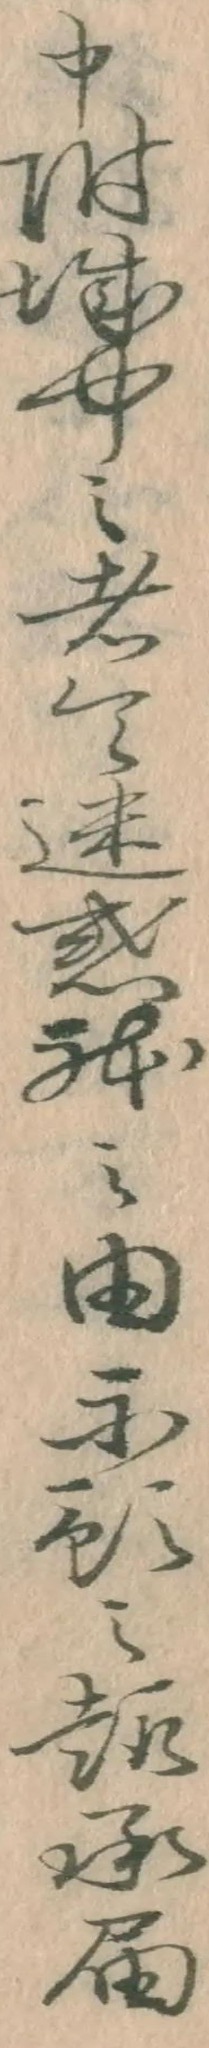申附城中之者令迷惑躰之由示預之趣承届
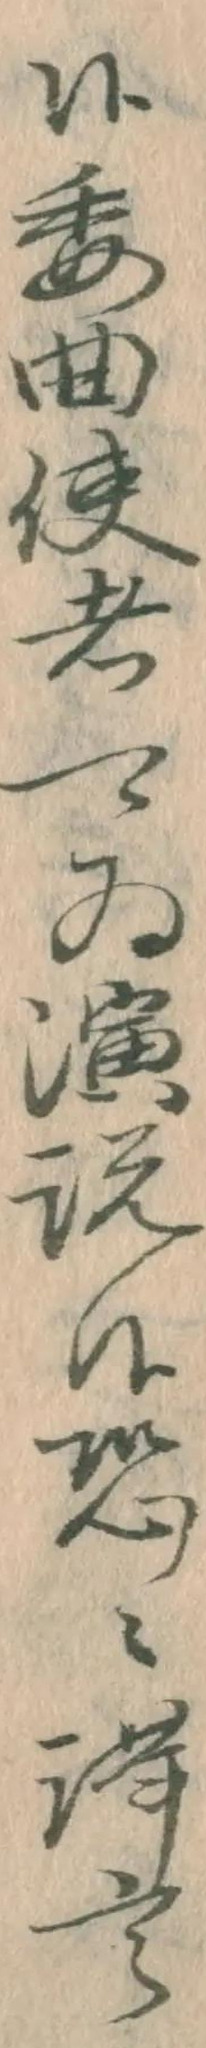候委曲使者可ゐ演説候恐々謹言
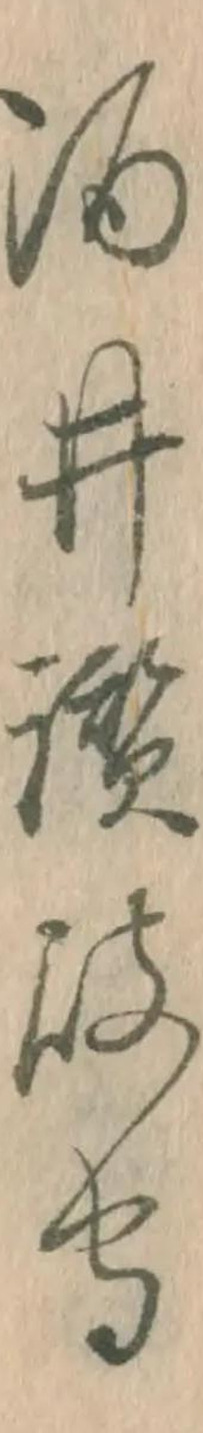酒井讃岐守
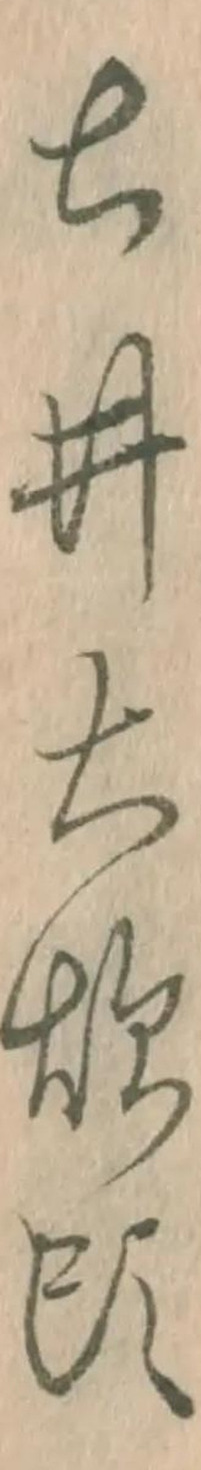土井大炊頭

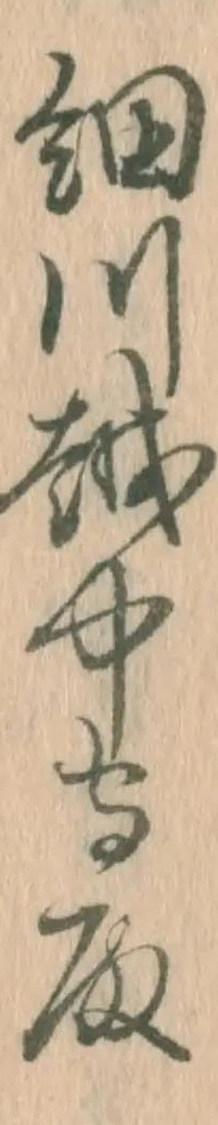細川越中守殿
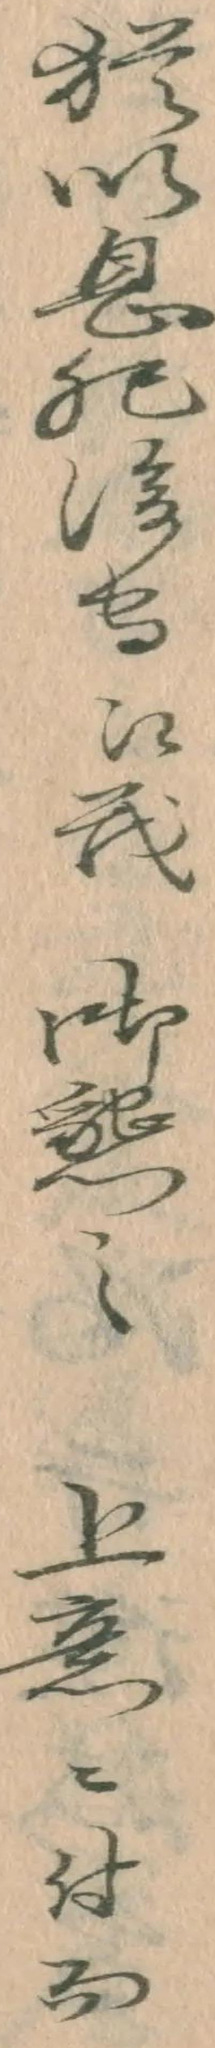猶以息肥後守江茂御懇之上意に付而
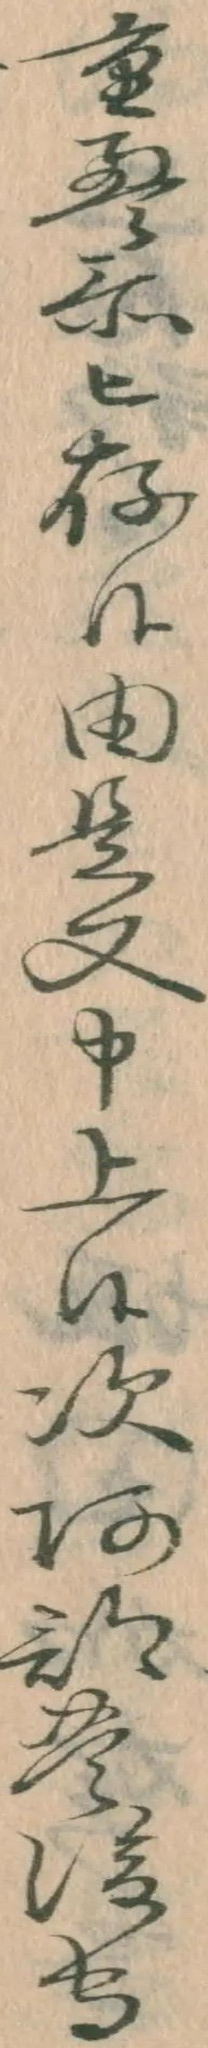重畳忝被存候由是又申上候次阿部豊後守
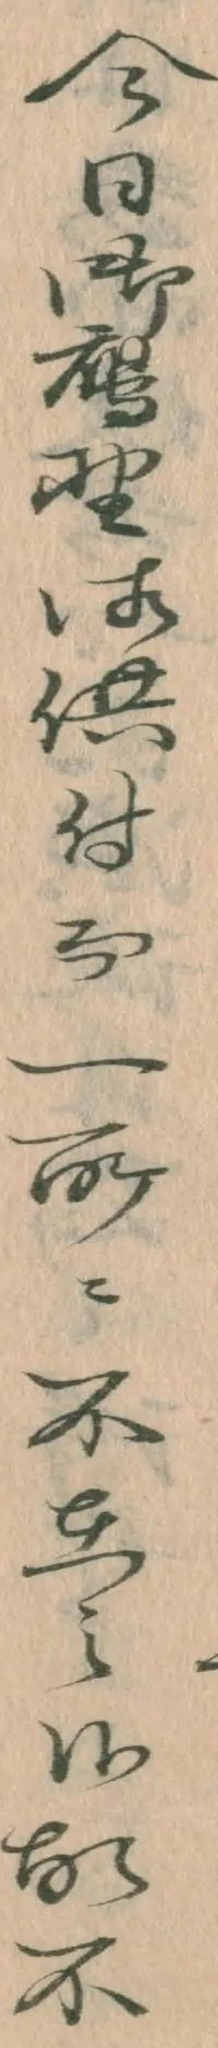今日御鷹野御供付而一所に不在之候故不
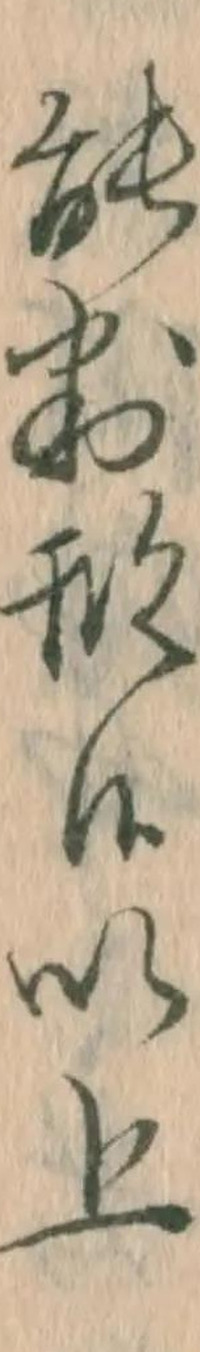能判形候以上
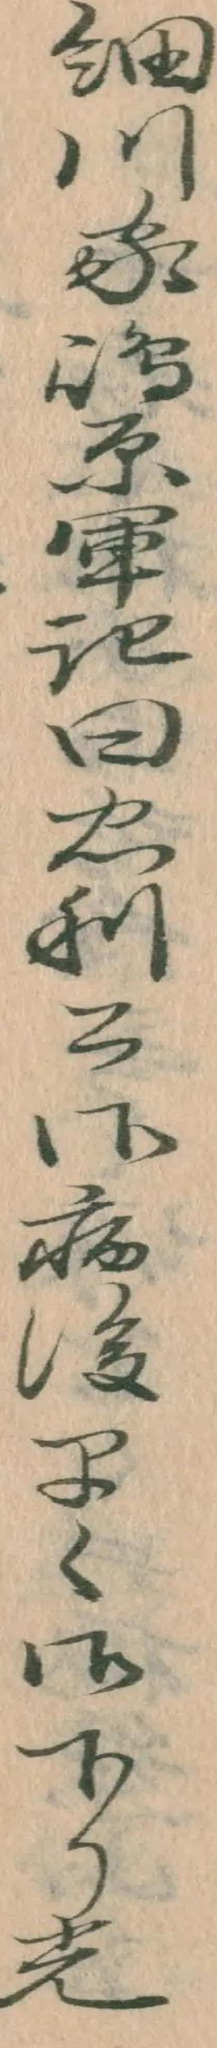細川家島原軍記曰忠利公御疵後早く御下り光
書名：切支丹御退治記 49巻. [9]
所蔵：国立国会図書館 National Diet Library, JAPAN
